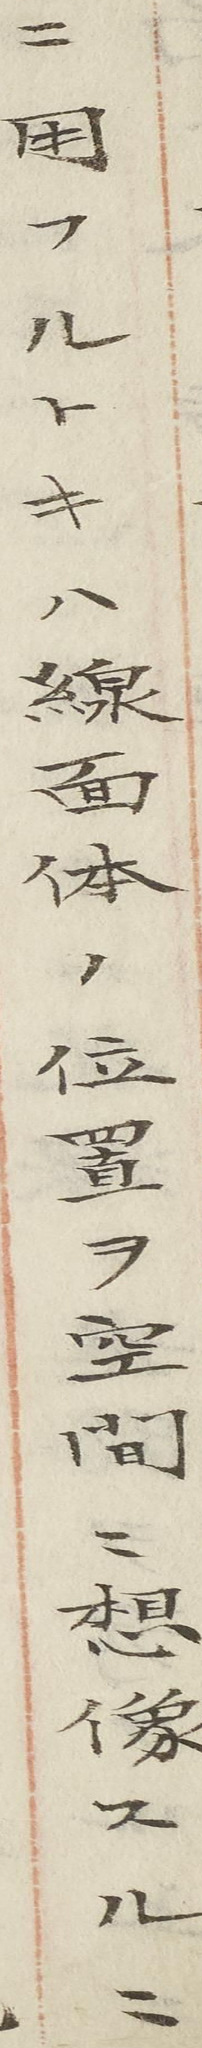ニ用フルトキハ線面体ノ位置ヲ空間ニ想像スルニ
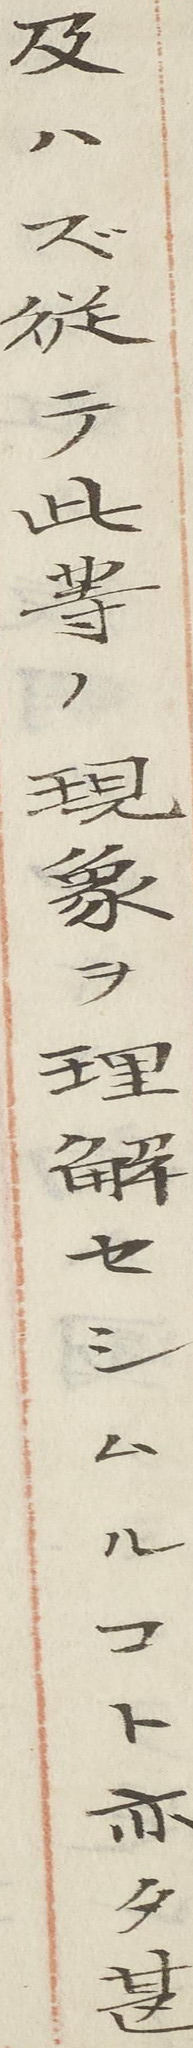及ハズ従テ此等ノ現象ヲ理解セシムルコト亦タ甚
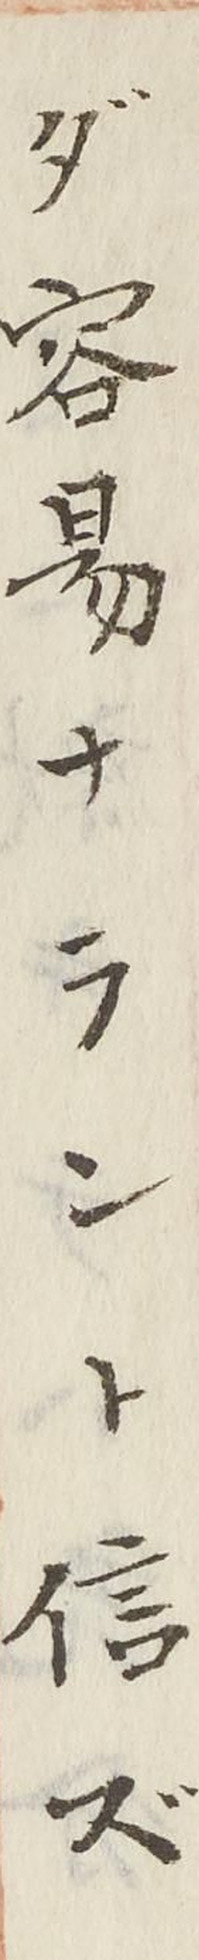ダ容易ナラント信ズ
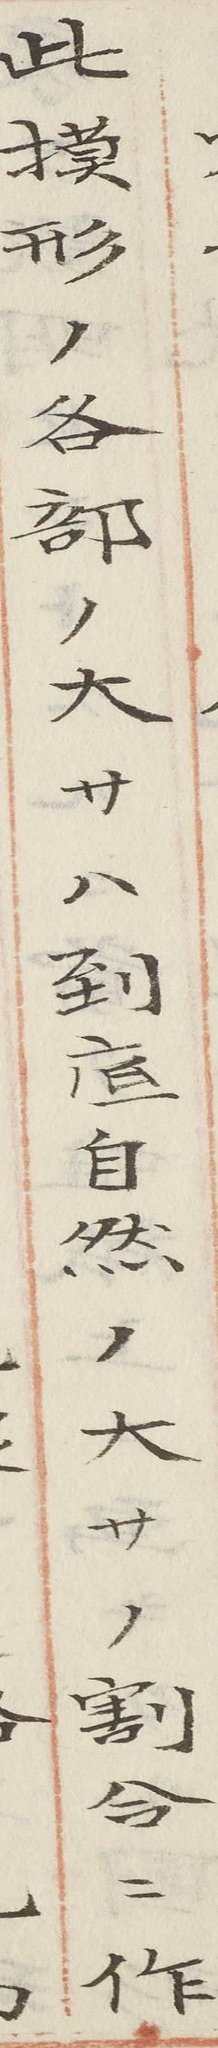此摸形ノ各部ノ大サハ到底自然ノ大サノ割合ニ作
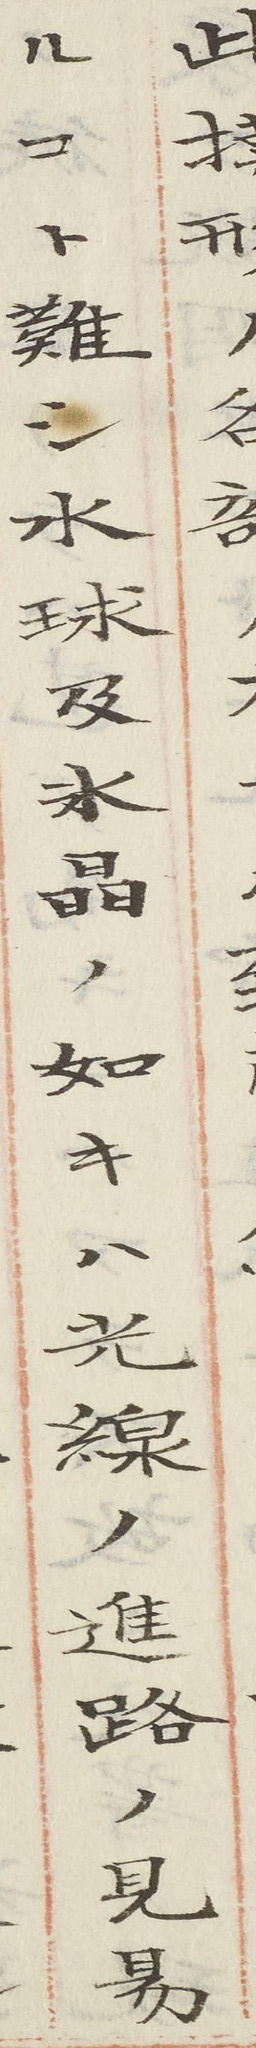ルコト難シ水球及水晶ノ如キハ光線ノ進路ノ見易
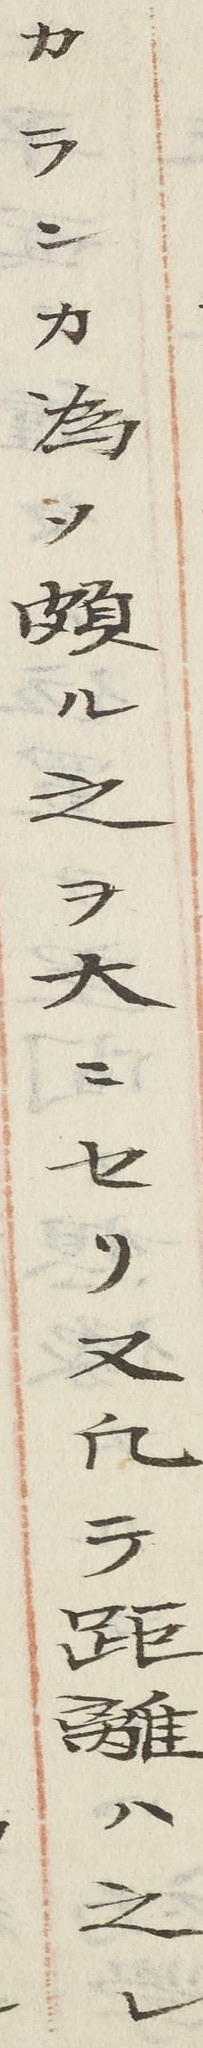カランカ為メ頗ル之ヲ大ニセリ又凡テ距離ハ之レ
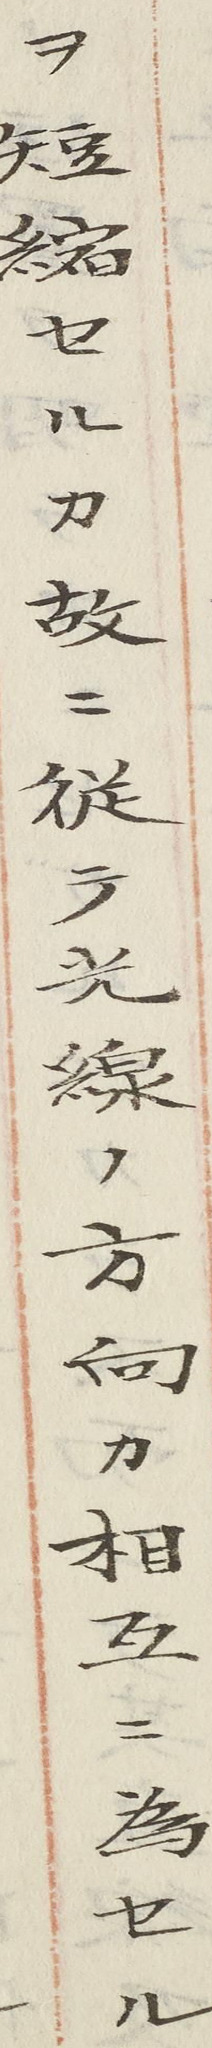ヲ短縮セルカ故ニ従テ光線ノ方向カ相互ニ為セル
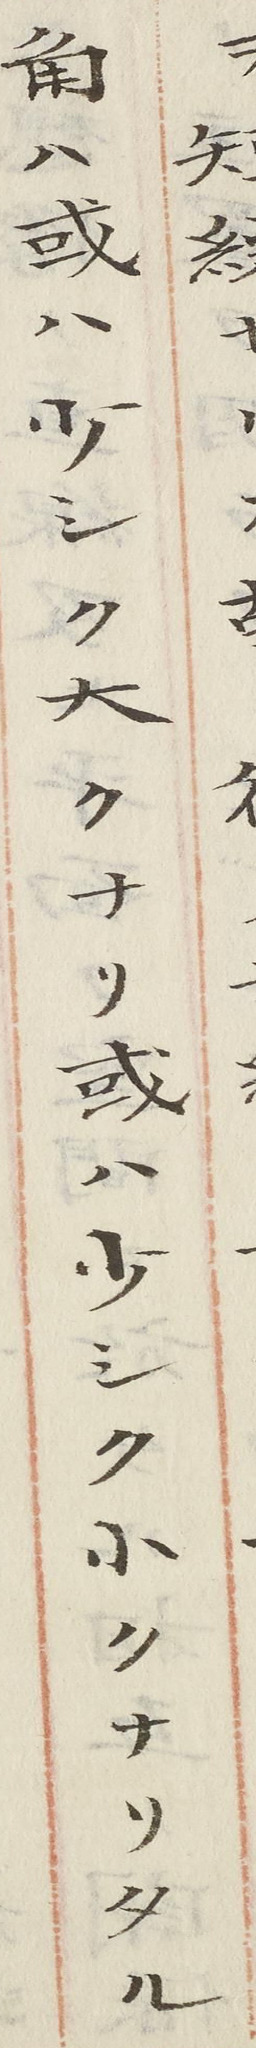角ハ或ハ少シク大クナリ或ハ少シク小クナリタル
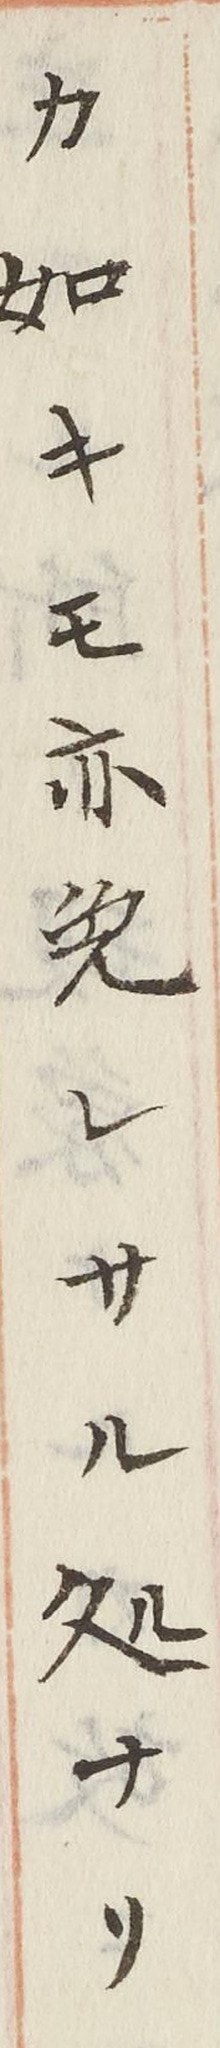カ如キモ亦免レサル処ナリ
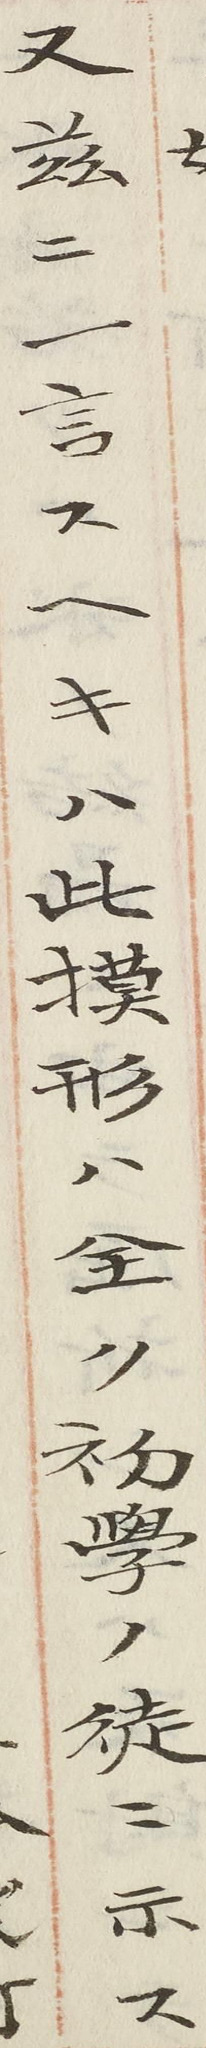又茲ニ一言スヘキハ此摸形ハ全ク初学ノ徒ニ示ス
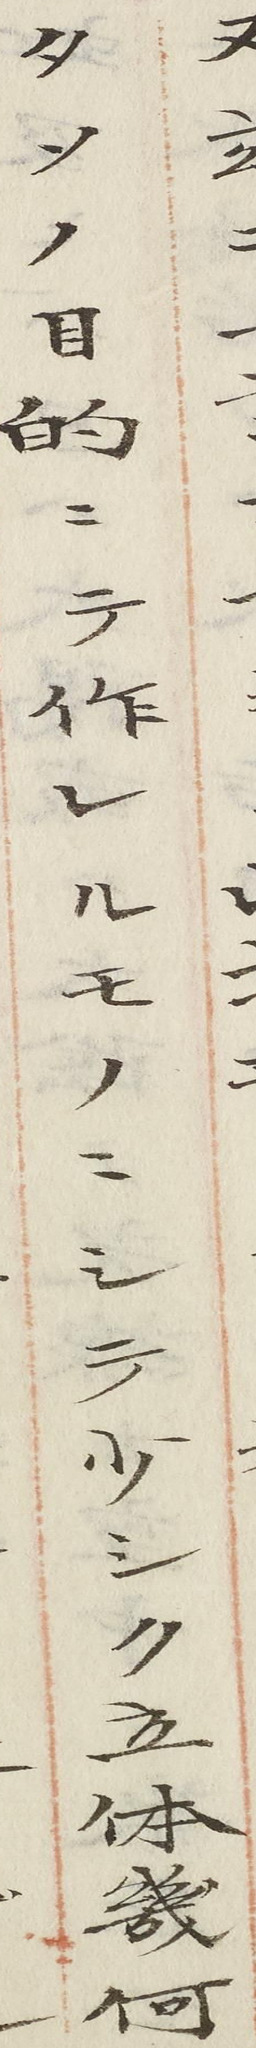タメノ目的ニテ作レルモノニシテ少シク立体幾何
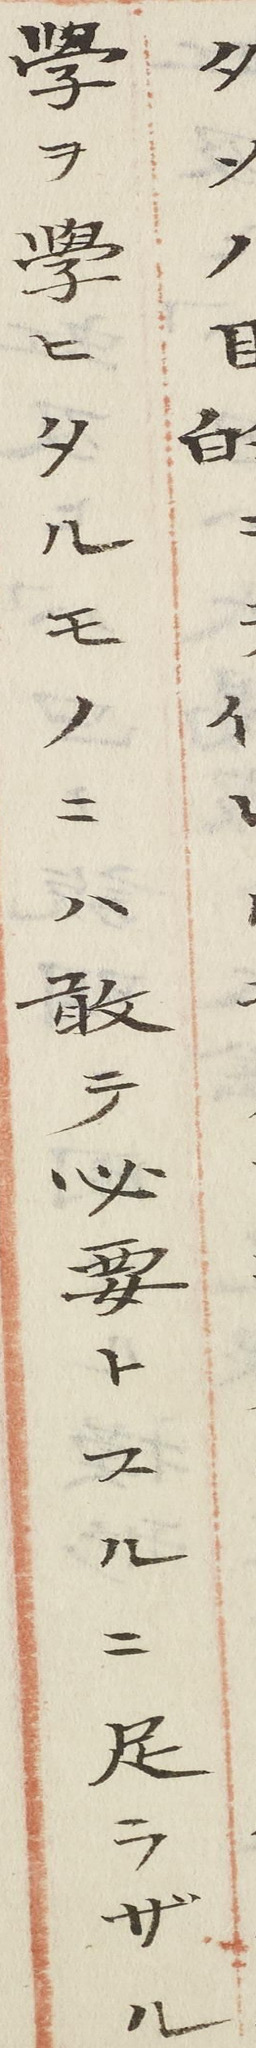学ヲ学ヒタルモノニハ敢テ必要トスルニ足ラザル
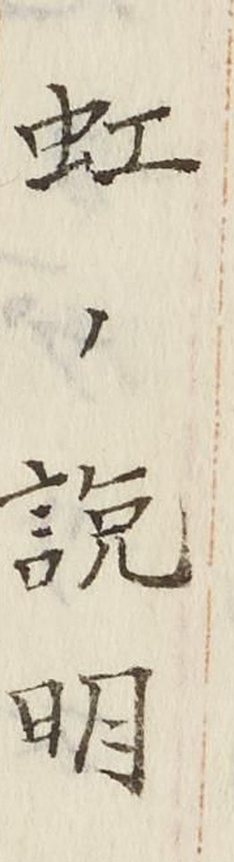虹ノ説明
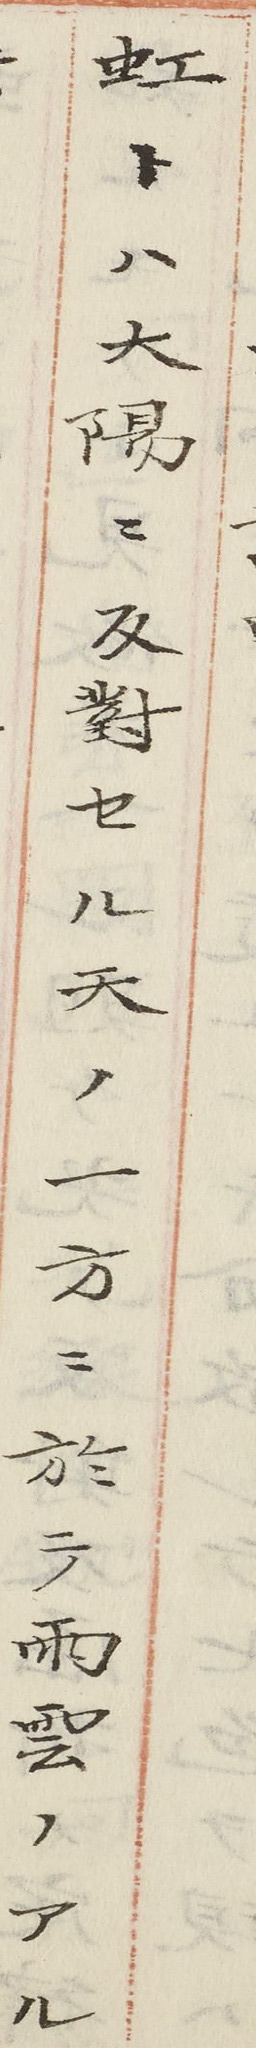虹トハ大陽ニ反対セル天ノ一方ニ於テ雨雲ノアル
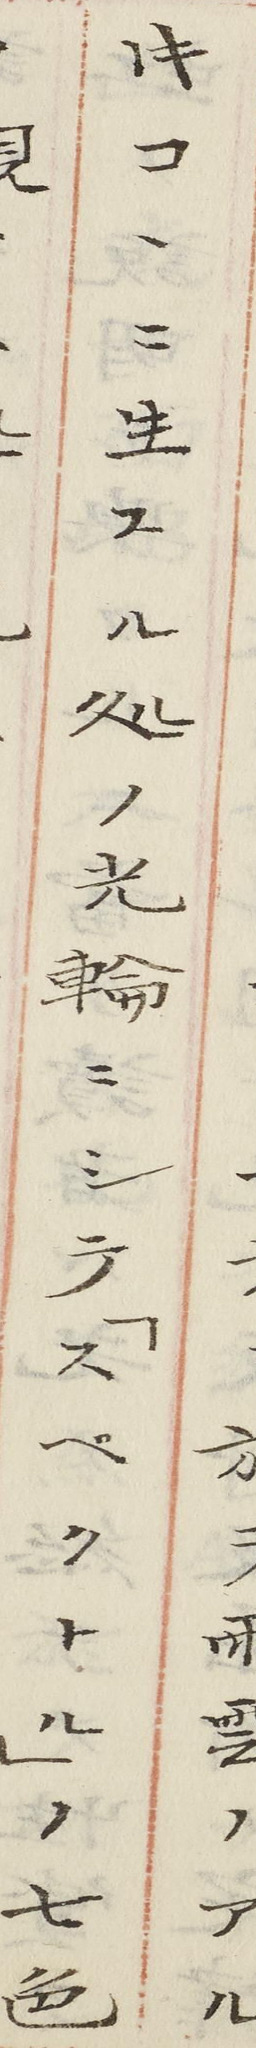トキコヽニ生スル処ノ光輪ニシテ「スペクトル」ノ七色
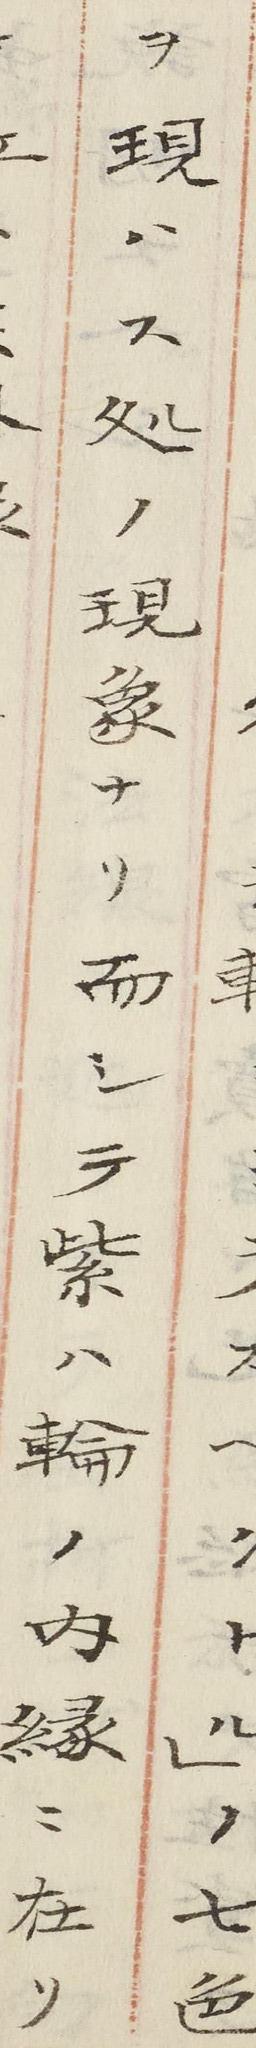ヲ現ハス処ノ現象ナリ而シテ紫ハ輪ノ内縁ニ在リ
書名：虹及ハロノ説明
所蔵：東京大学地震研究所図書室 Earthquake Research Institute Library, The University of Tokyo, JAPAN
